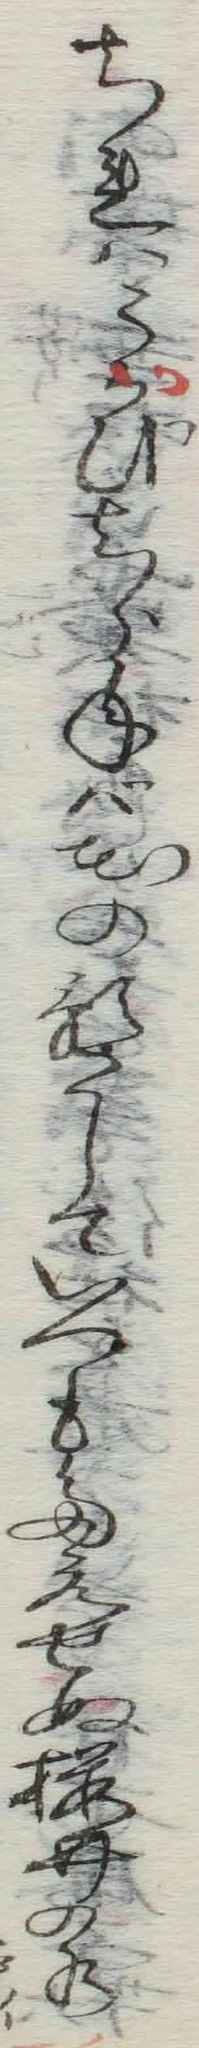ちれはうかひちらねば花の影さしていつもたえせぬ桜井の水白モ
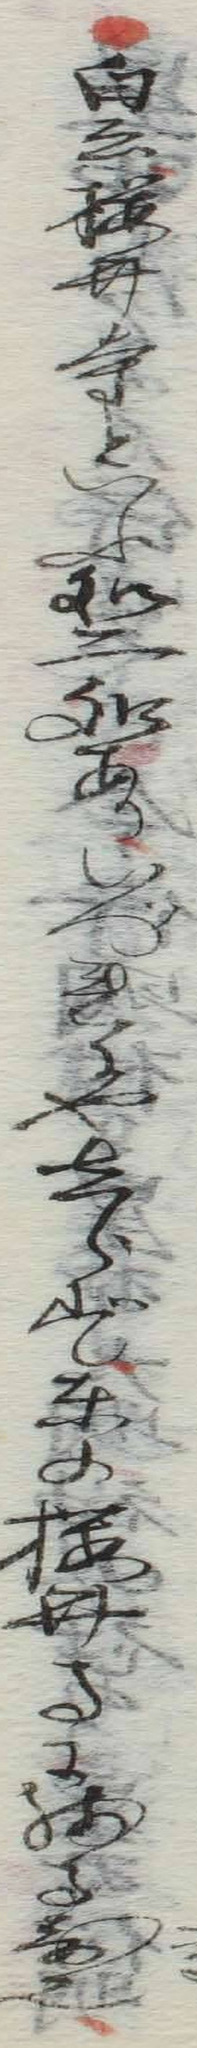●白云、桜井寺といふ処二処あり、いづれにやしらず、東の桜井寺に残る歌也、
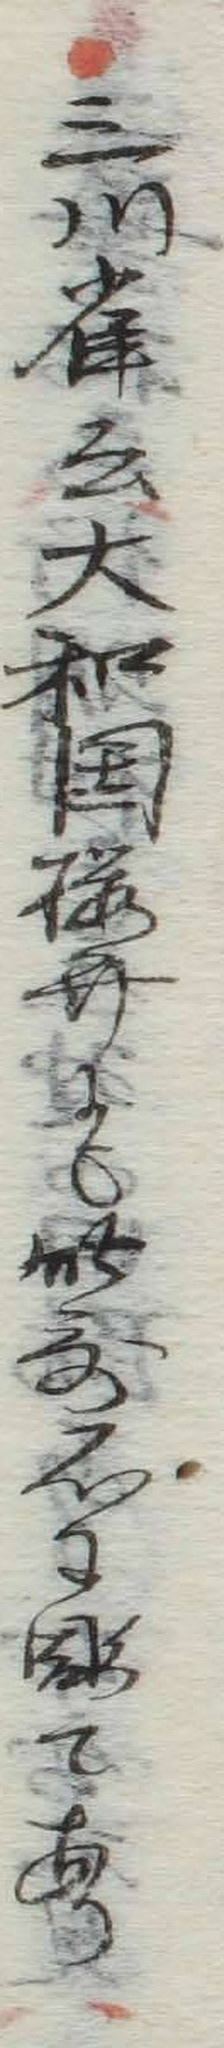●三川雀云、大和国桜井にも此歌石に彫てあり、

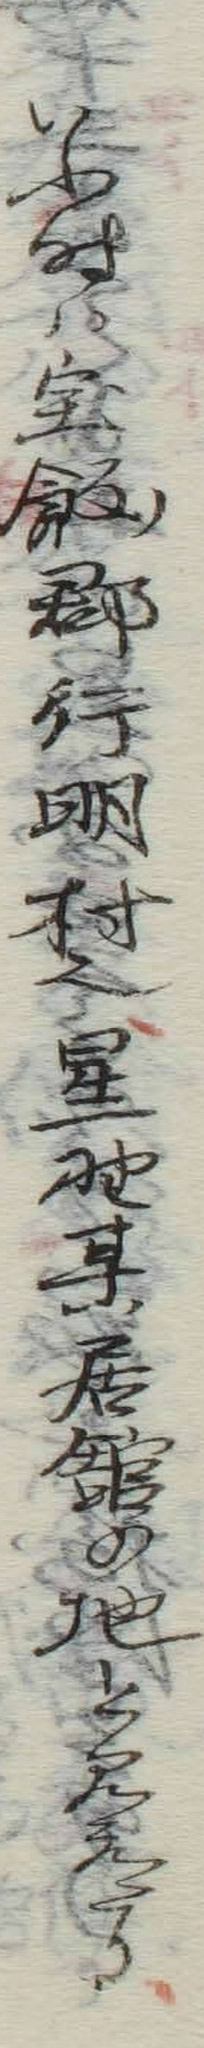いふ時は宝飯郡行明村也、星野某居舘の地と見えたり、
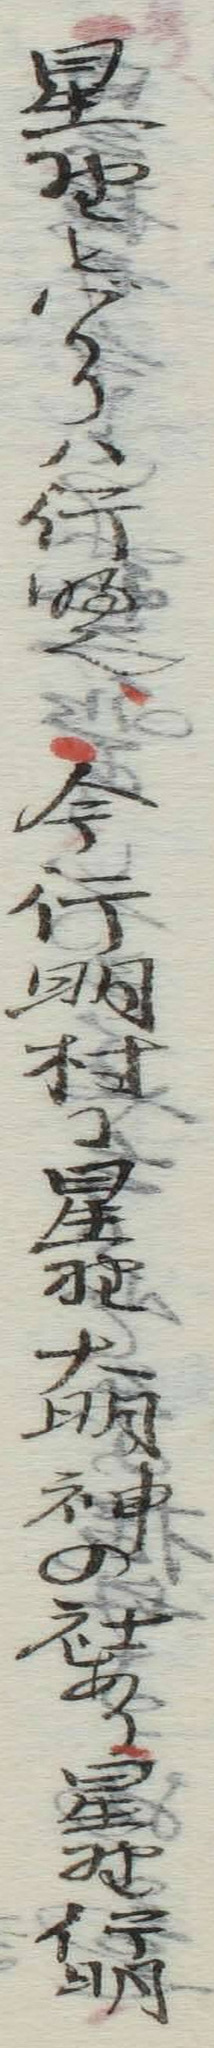星野とばかりは行明也、●今行明村に星野大明神の社あり、星野行明
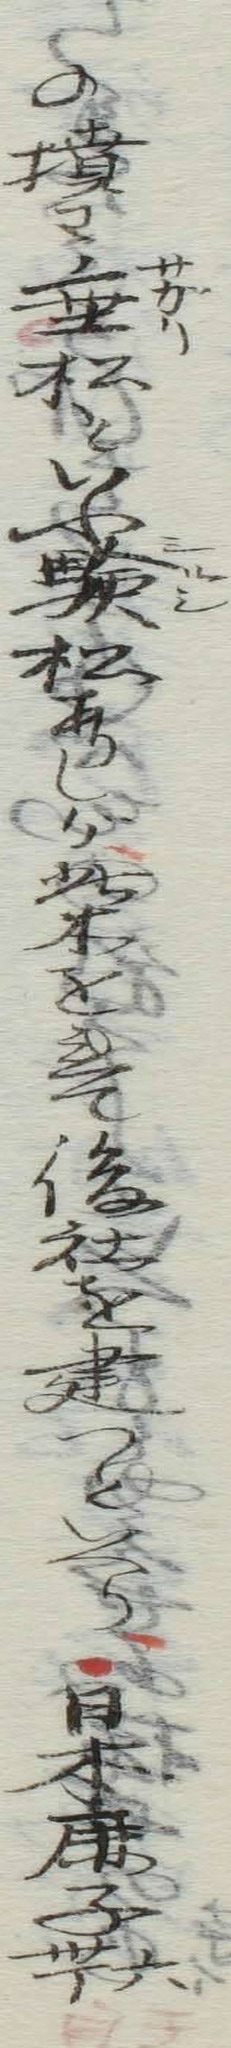の墳に垂松といふ験松ありしが、此木をれて後社を建つといへり、●日本鹿子六卅丁
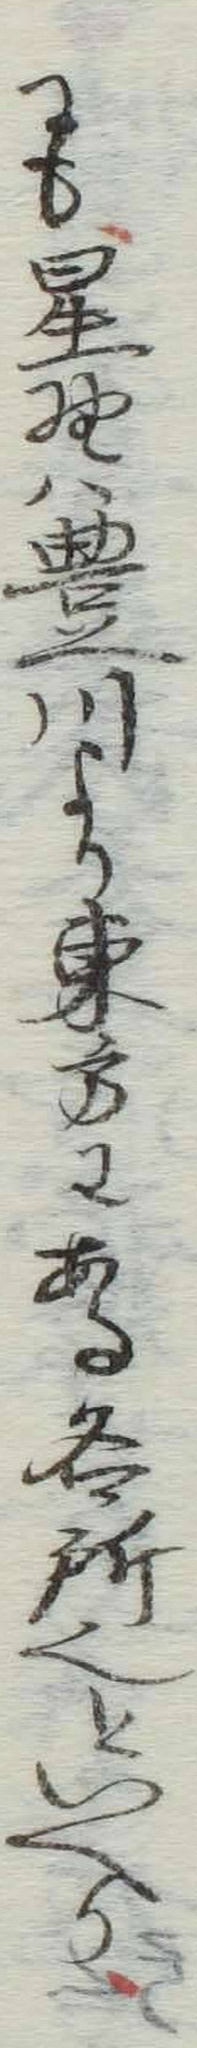にも、星野は豊川より東方にある名所也といへり、
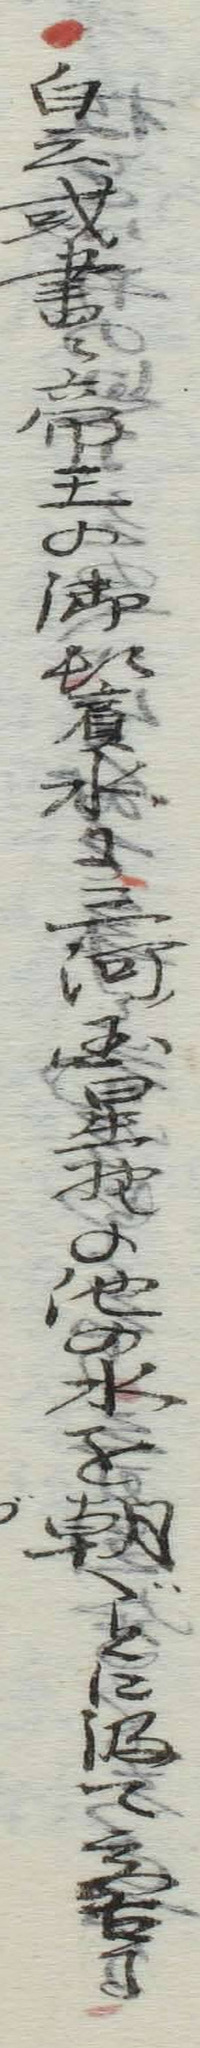●白云或書ニ帝王の御鬢水に三河国星野の池の水を朝ごとに汲て宮古に
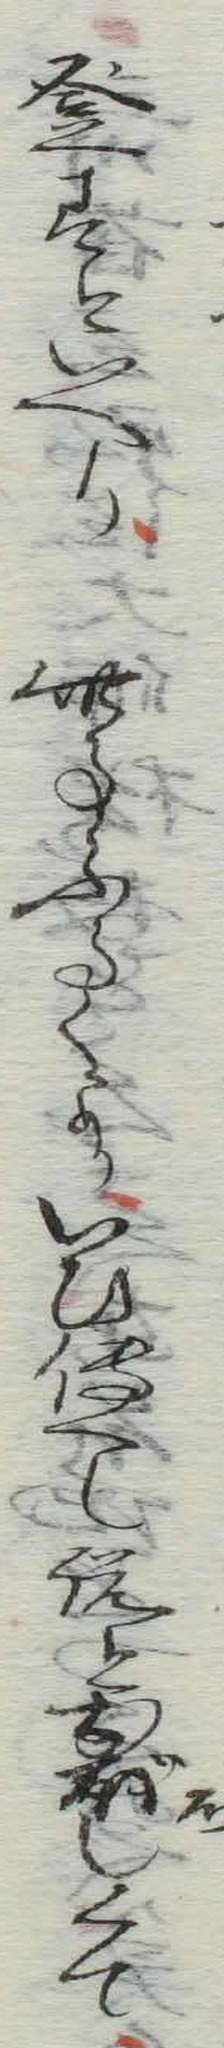登すといへり、此事ふるくより、いひ伝へし説とおぼしくて、
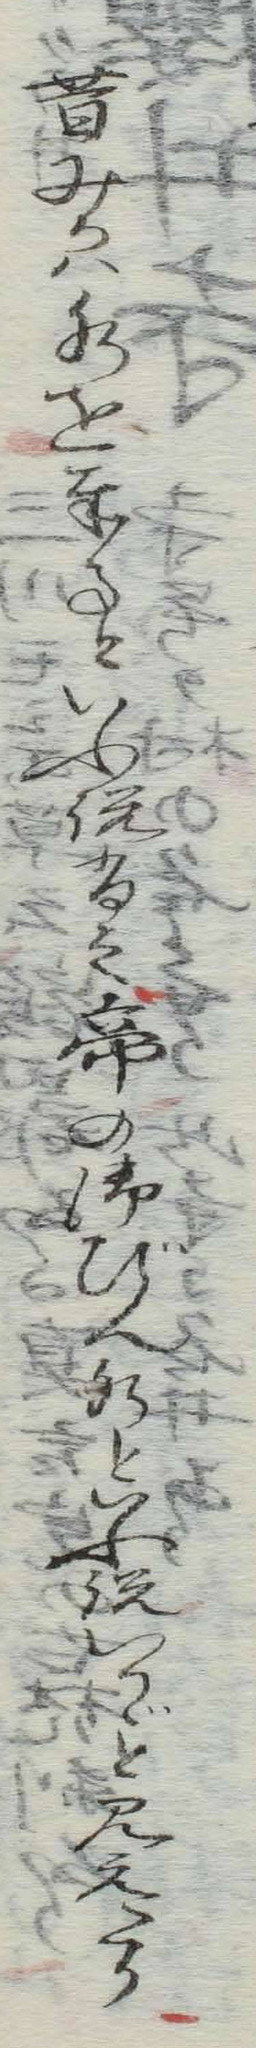昔みかは水を奉るといふ説有之、帝の御びん水といふ説いかゞと見えたり、
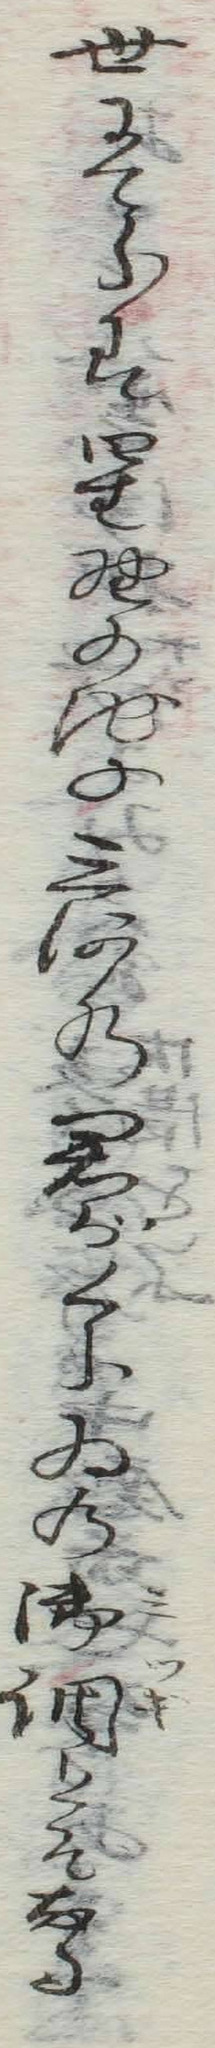世にてらす星野の池の三河水君がくらゐの御調とぞなる
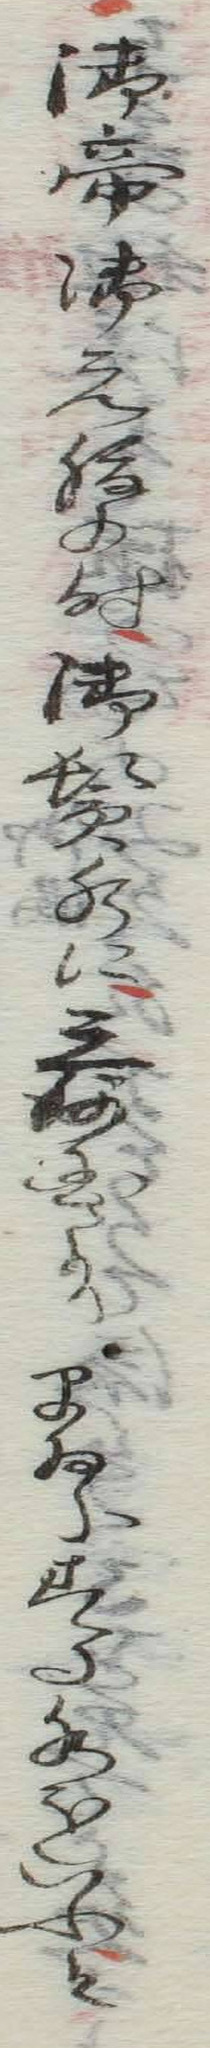●御帝御元服の時、御鬢水に、参河国よりまゐらする水をいふ、と
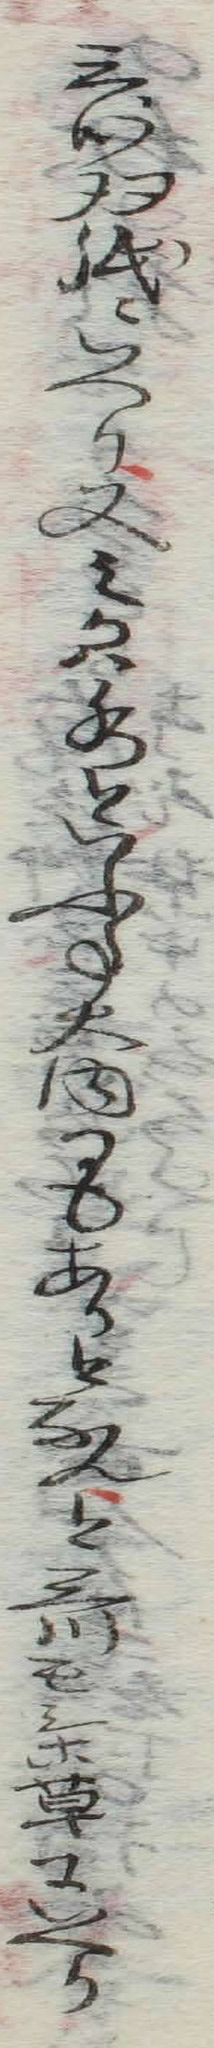三河双紙ニいへり、又みかは水といふ事大内にもありとなん、と三川モシホ草にいへり
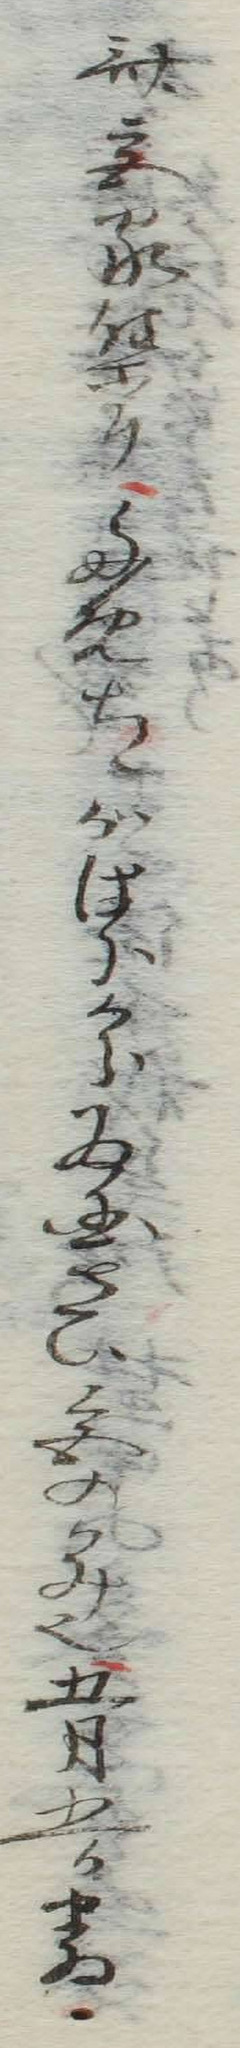斎宮家集に、ためちゝがはらから為国さい宮のかみ也、五月五日まゐ
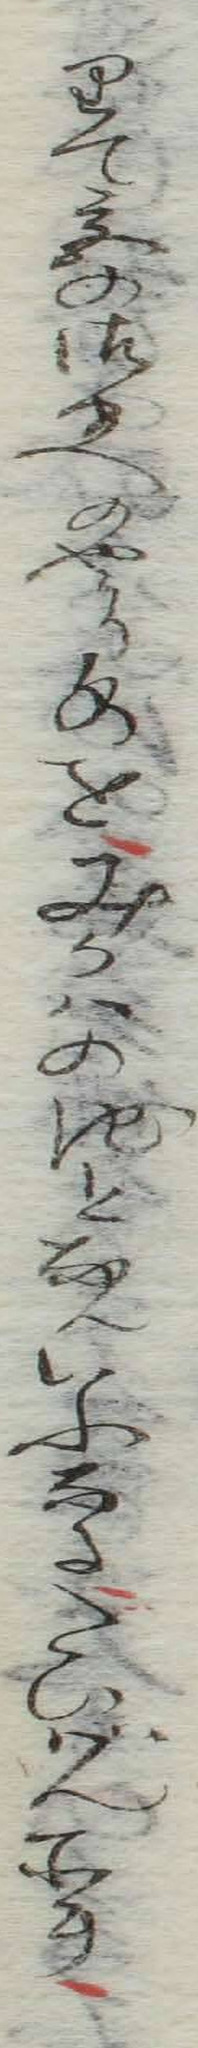りて宮の御まへのやり水を、みかはの池となんいふなる、だいばん所に、

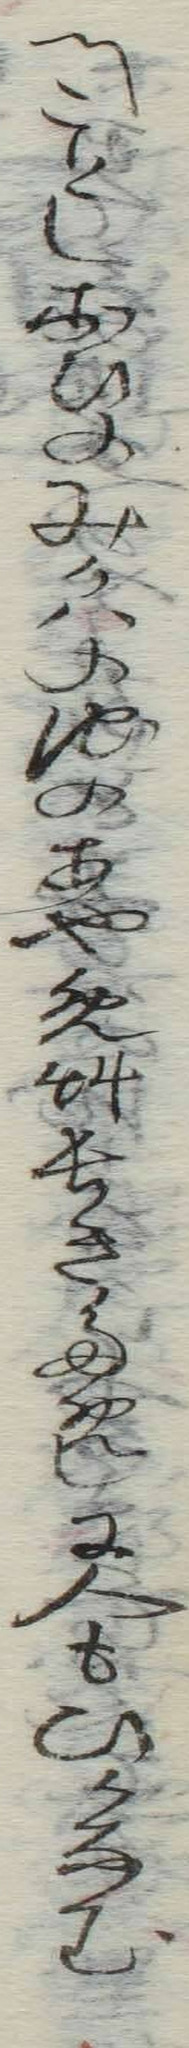〽ことしおひのみかはの池のあやめ艸長きためしに人もひかなむと
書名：三河国古跡考
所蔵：国文学研究資料館
